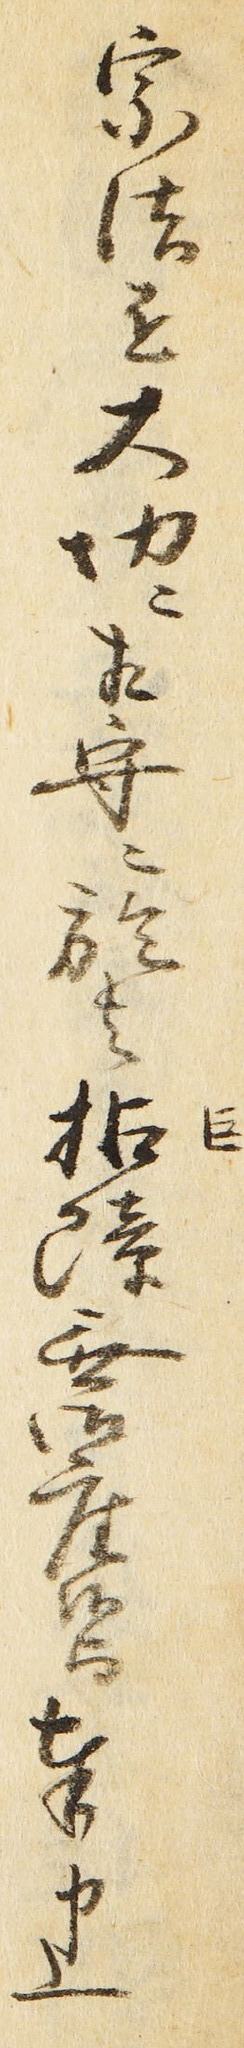宗法を大切に相守に於は拒障無御座候と奉申上
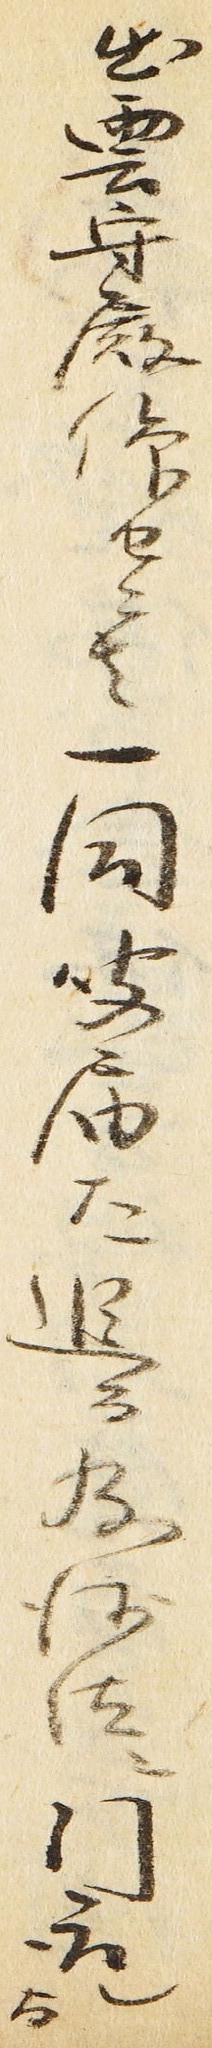出雲守殿仰せには一同聞届た追而及沙汰に引取レと
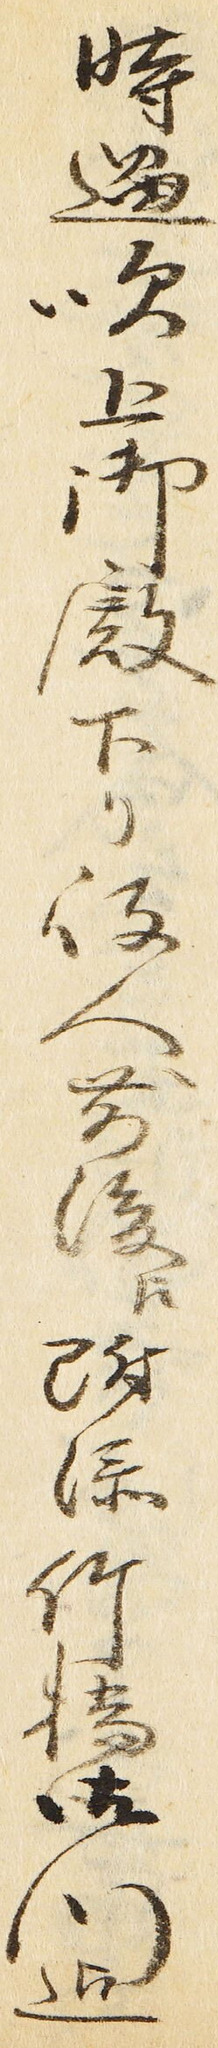時過吹上御殿下り役人前後江附添竹橋御門迠
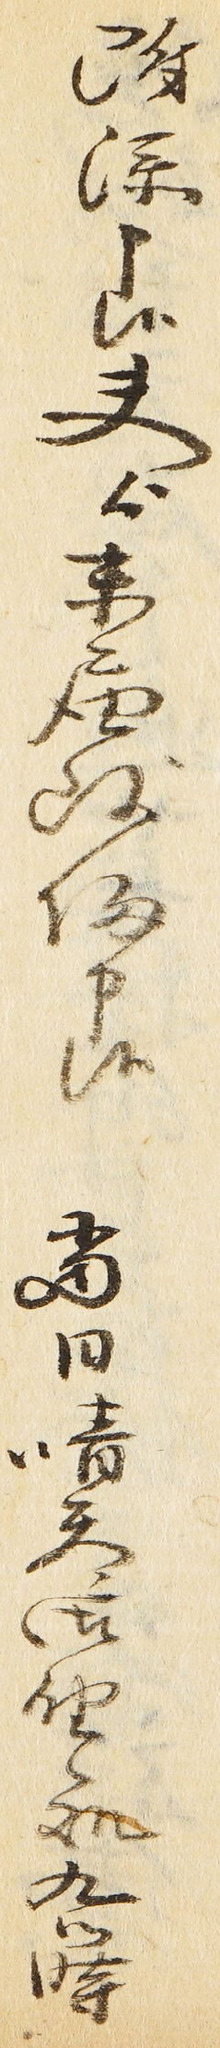附添申候夫ゟ未届致帰申候当日晴天に御座候処九ツ時
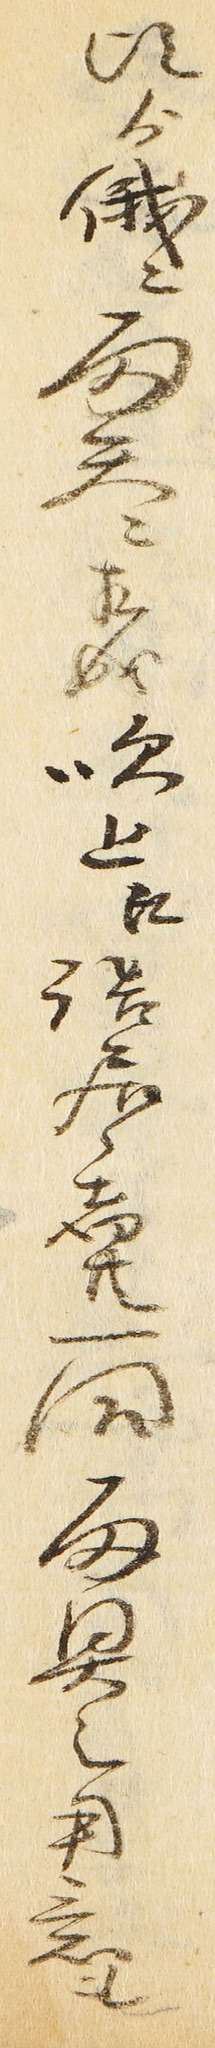頃ゟ俄に雨天に相成吹上江詰居候者共一同雨具之用意も
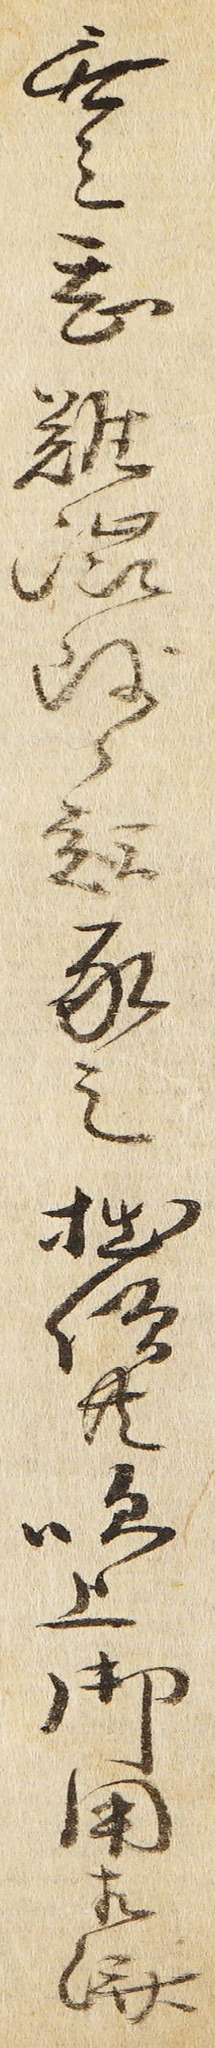無之甚難渋致候趣承之拙僧共吹上御用相済
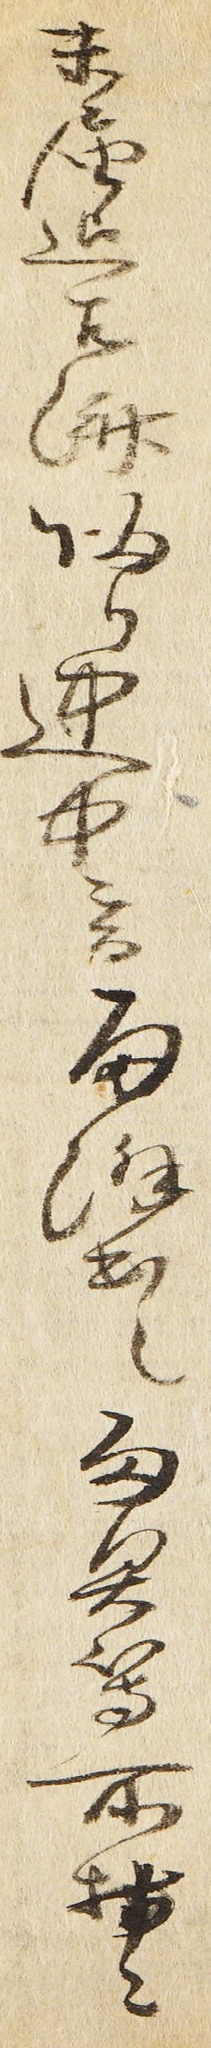未届迠相済帰り迚中に而雨降出し雨具等所持に
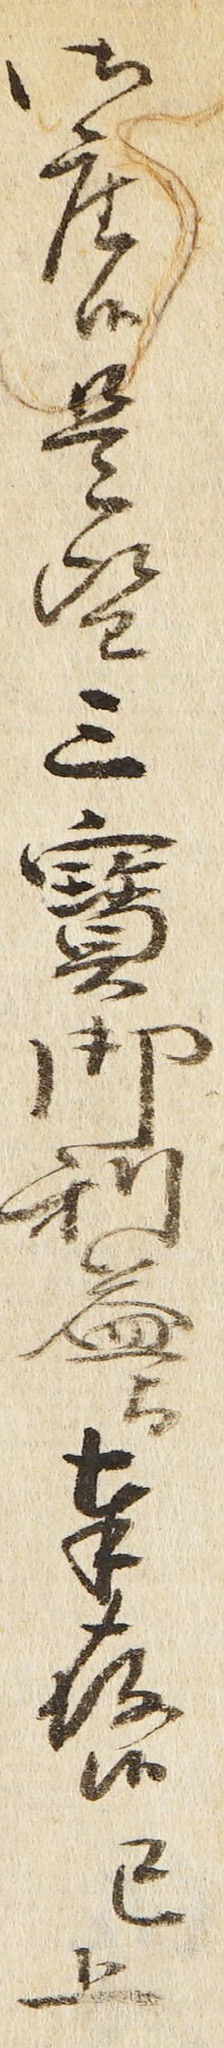御座候是皆三宝御利益と奉存候已上
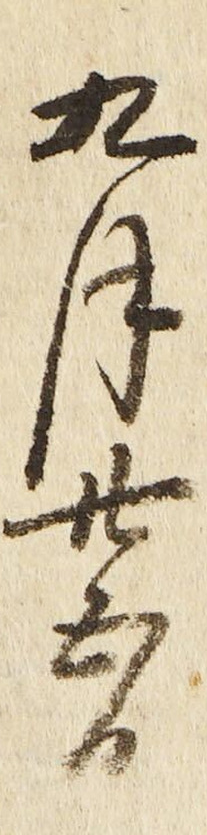九月廿五日
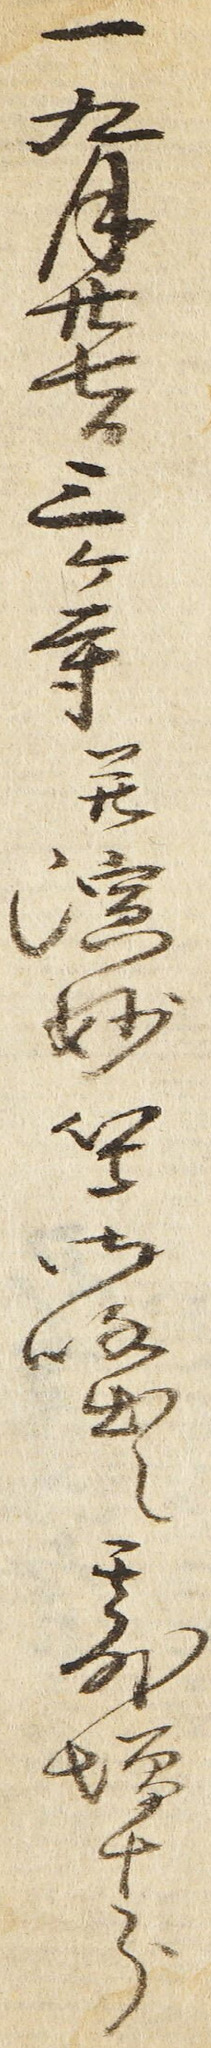一九月廿七日三ケ寺并演妙等御呼出し其外増十郎
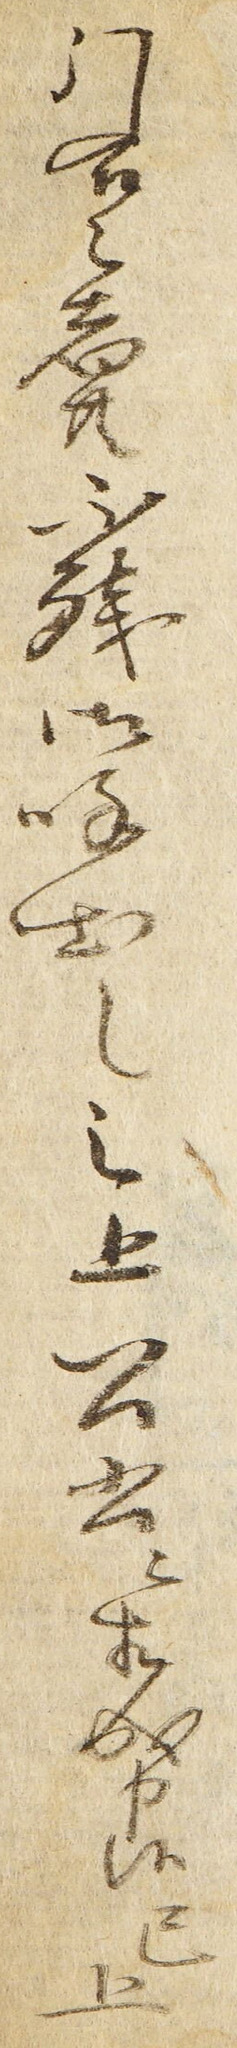引合之者共不残御呼出し之上召出に相成申候已上

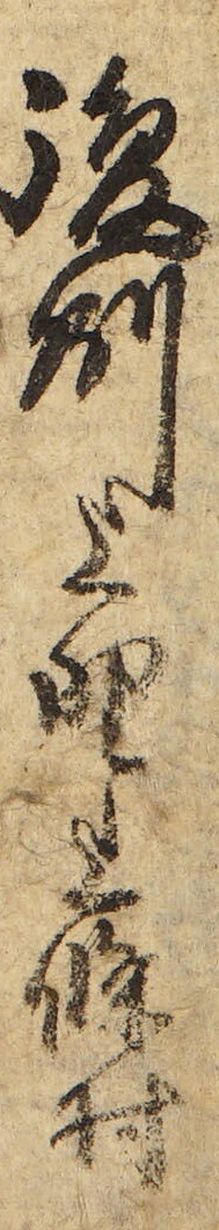駿州上野上條村
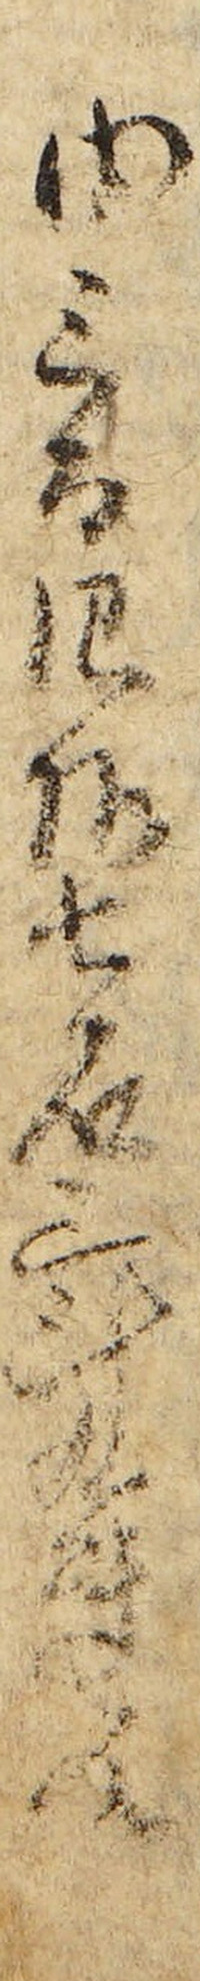内三百四拾七石三斗九升
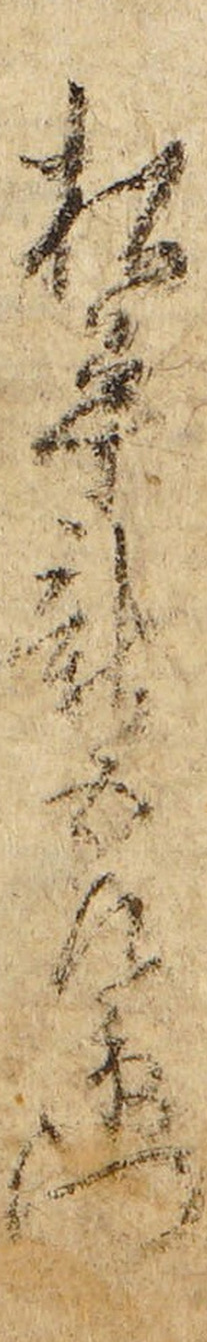松新五左衛門
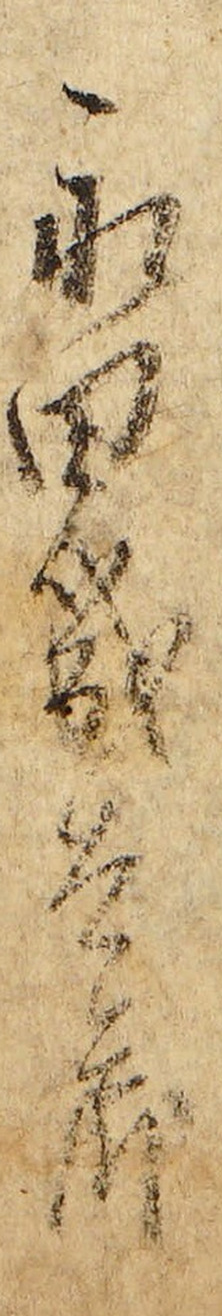永田幾兵衛
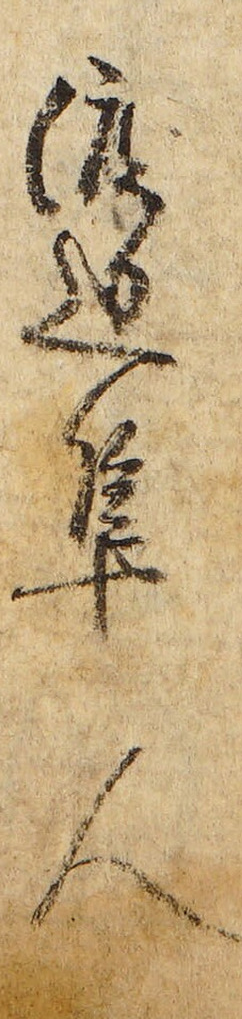渡辺隼人
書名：異流一件日記
